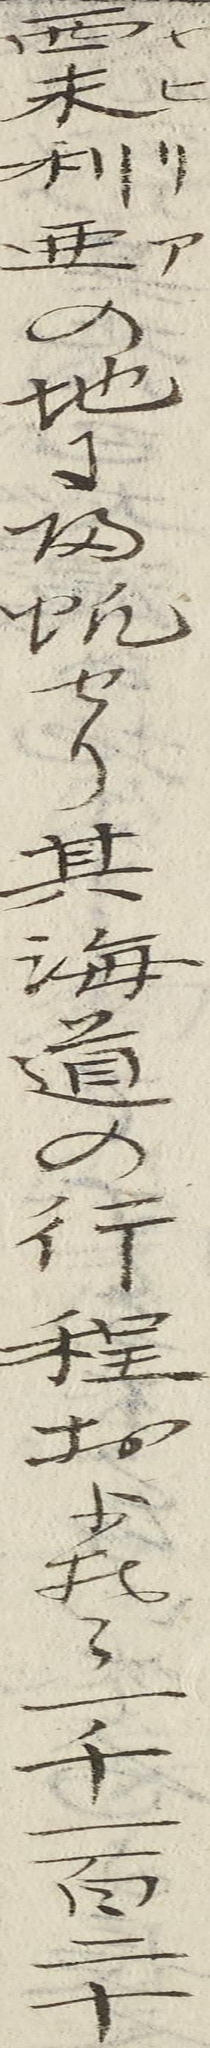西未利亜の地に帰帆せり其海道の行程およそ一千一百二十
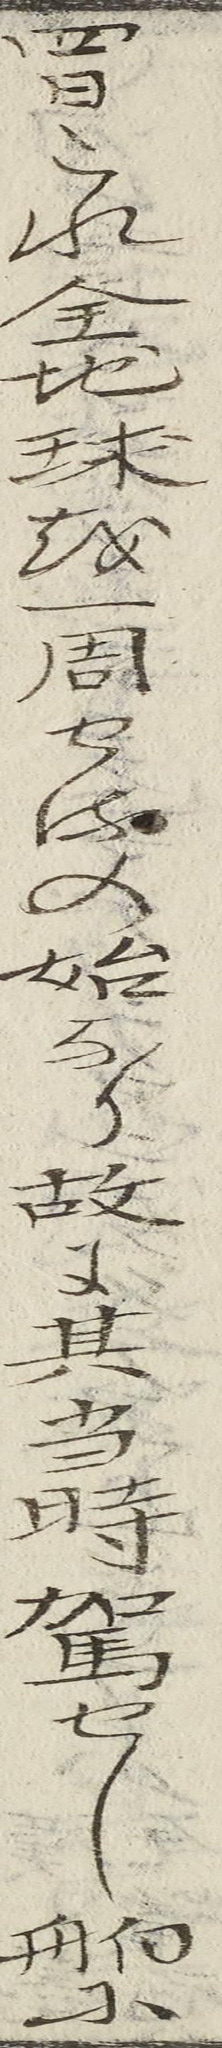四日これ全地球を一周せるの始なり故に其当時駕せし舶に
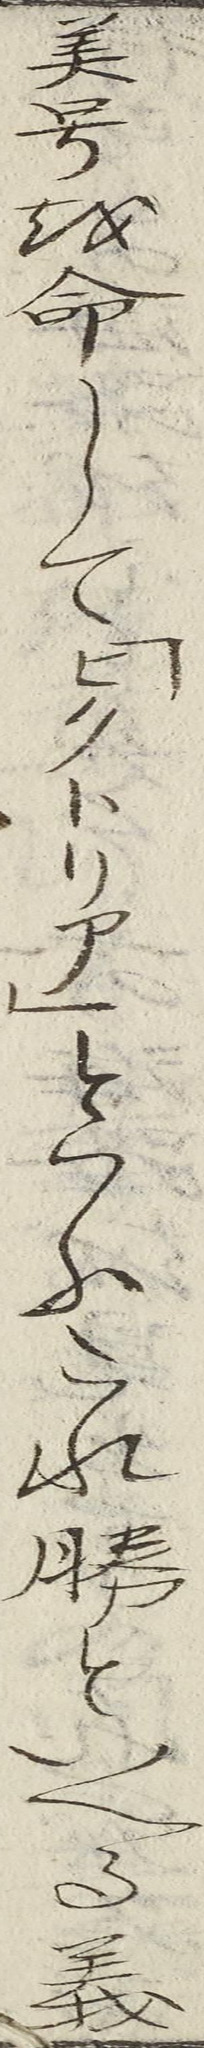美号を命して「ヒクトリア」といふこれ勝といへる義
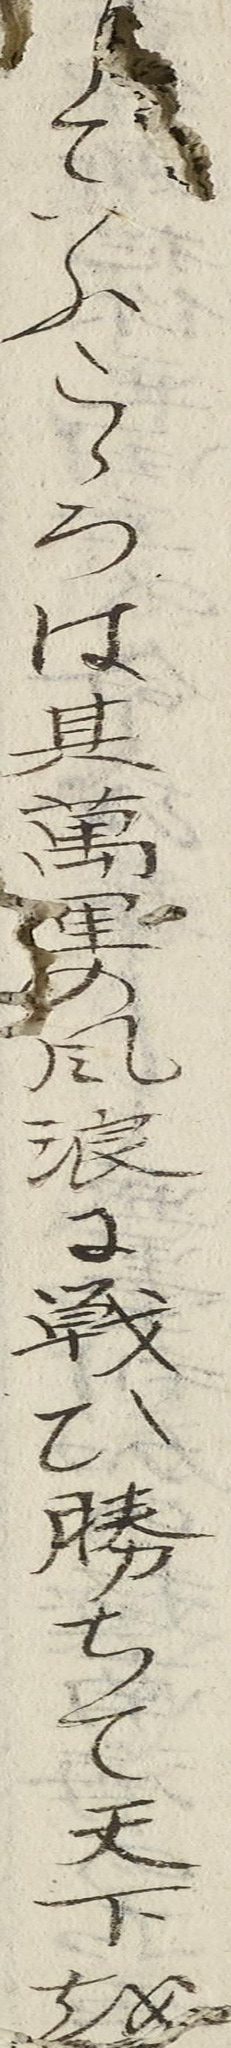していふこゝろは其万里の風浪に戦ひ勝ちて天下を
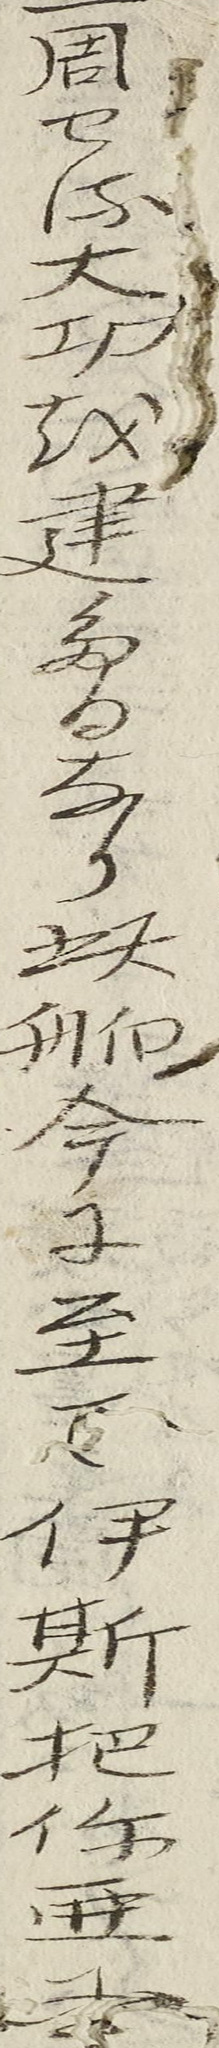一周せる大功を建たるなり此舶今至て伊斯把你亜国
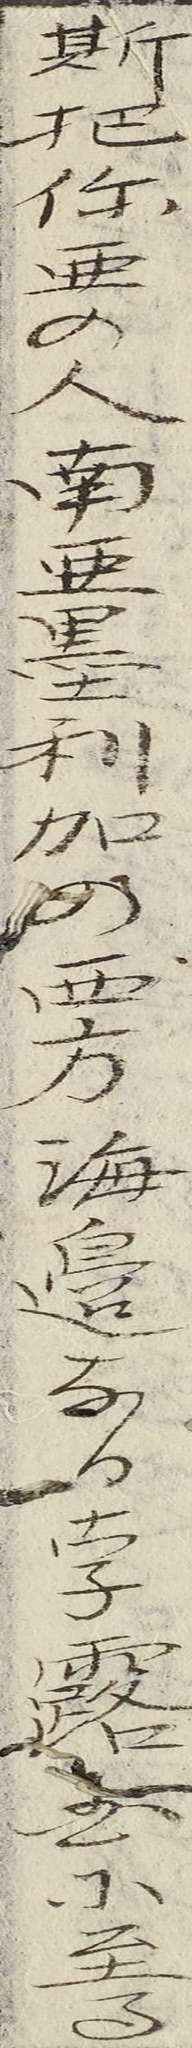斯把你亜の人南亜墨利加の西方海辺なる孛露国に至る
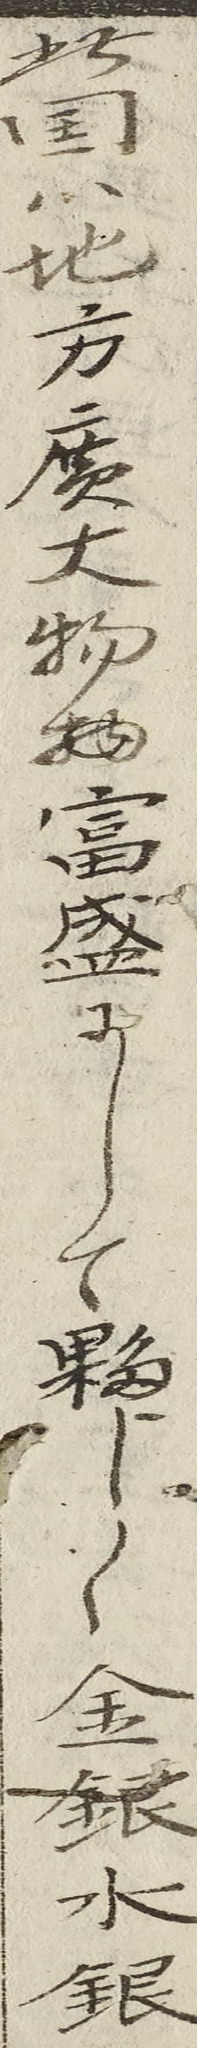此国は地方広大物物富盛にして夥しく金銀水銀
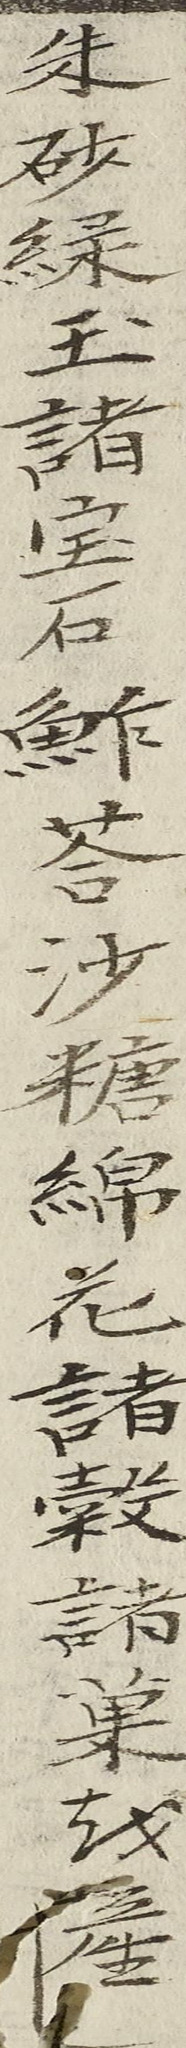朱砂緑玉諸宝石鮓荅沙糖綿花諸穀諸菓を産し
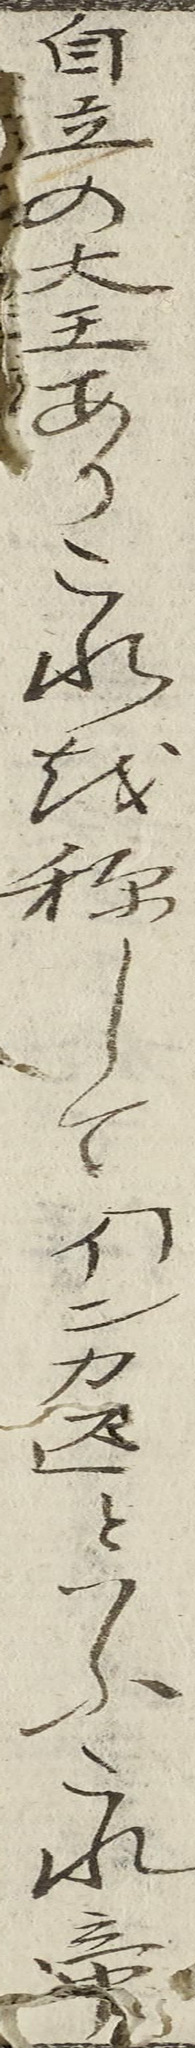自立の大王ありこれを称して「インカス」といふこれ帝
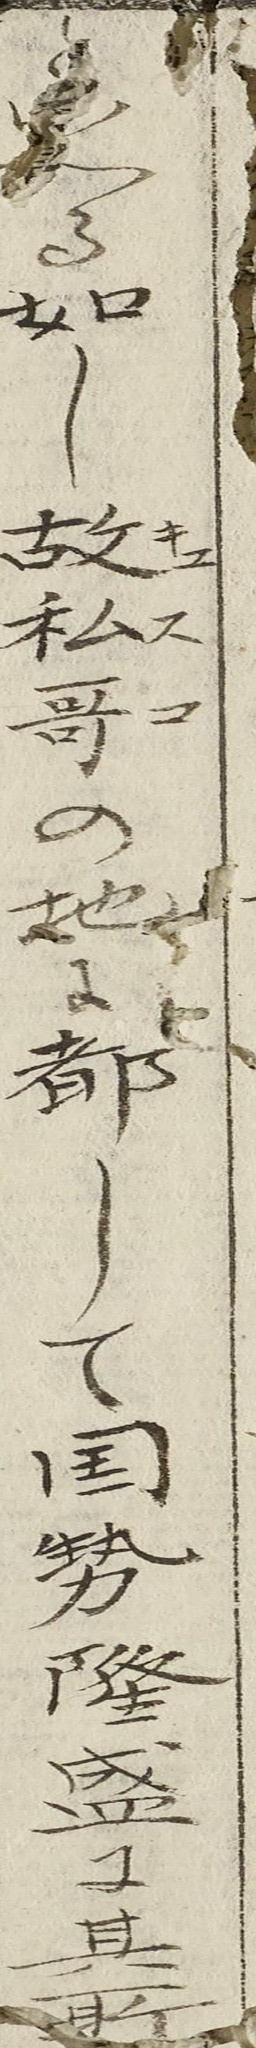といへる如し故私哥の地に都して国勢隆盛に其所
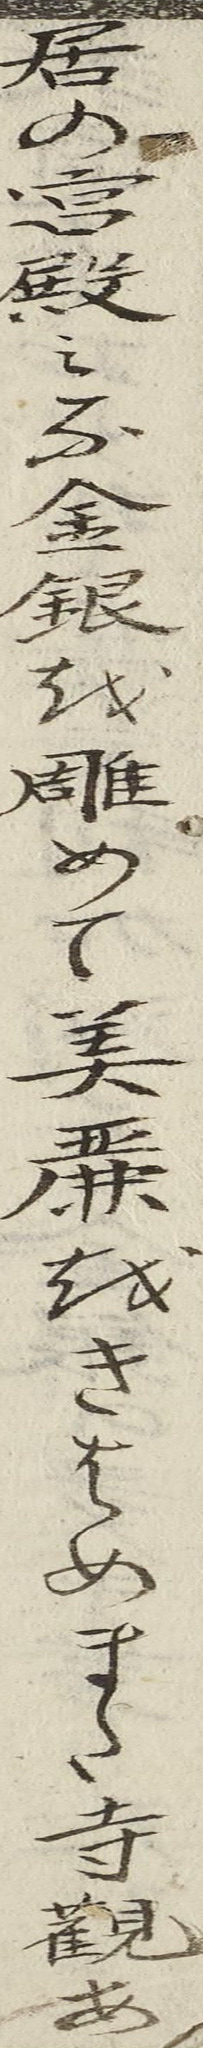居の宮殿ミな金銀を雕めて美麗をきはめまた寺観あ
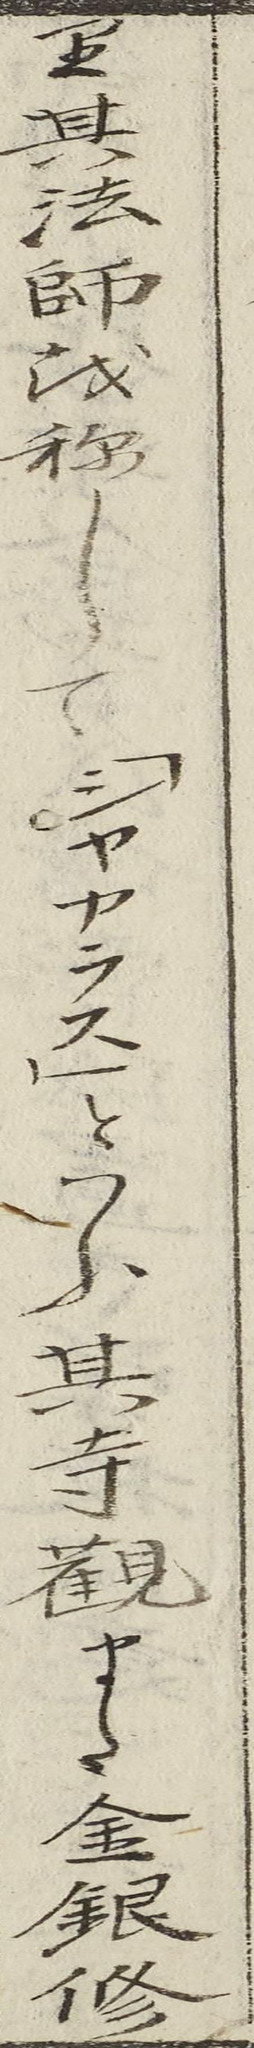り其法師を称して「シヤラス」といふ其寺観また金銀修
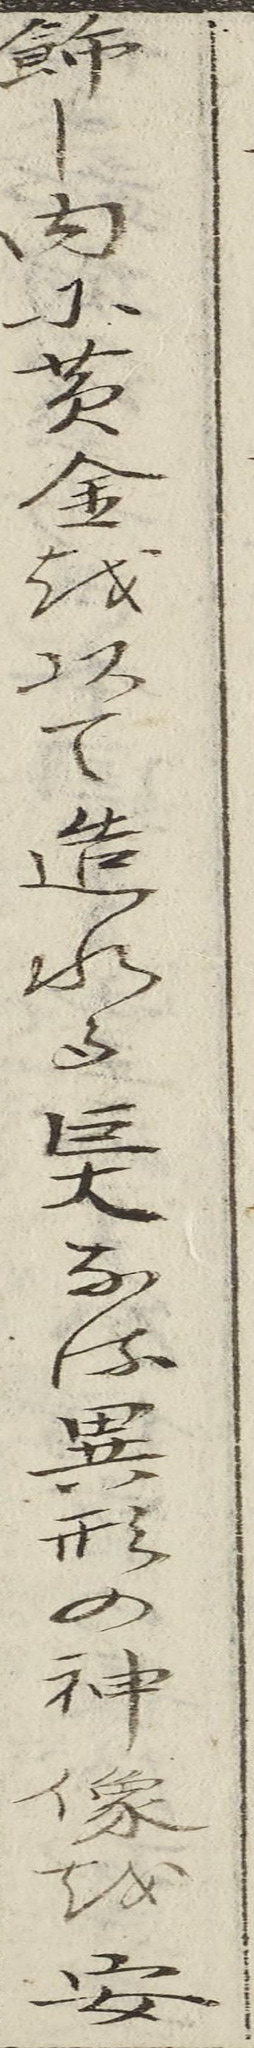飾し内に黄金を以て造れる巨大なる異形の神像を安
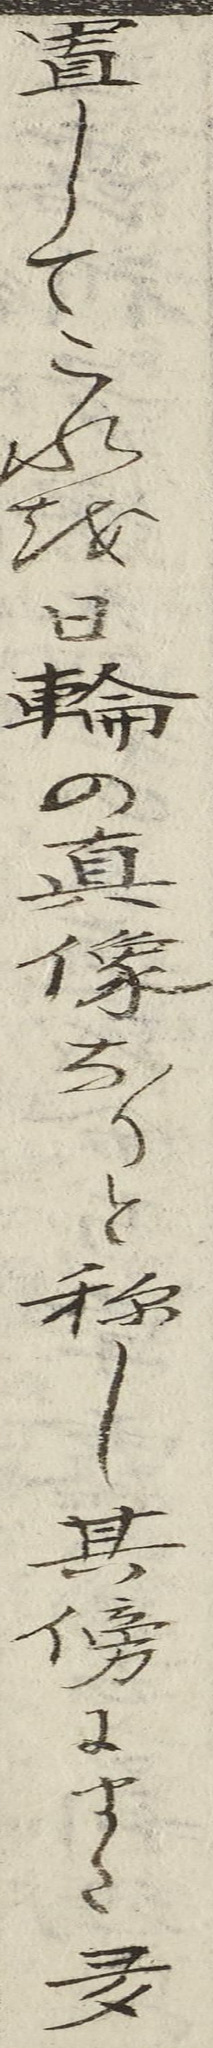置してこれを日輪の真像なりと称し其傍にまた多
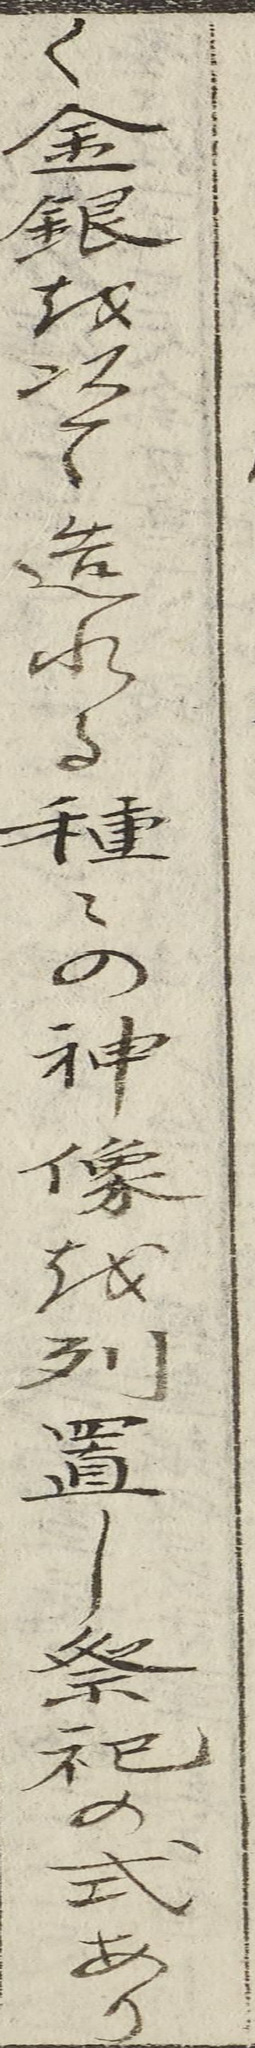く金銀を以て造れる種々の神像を列置し祭祀の式あり
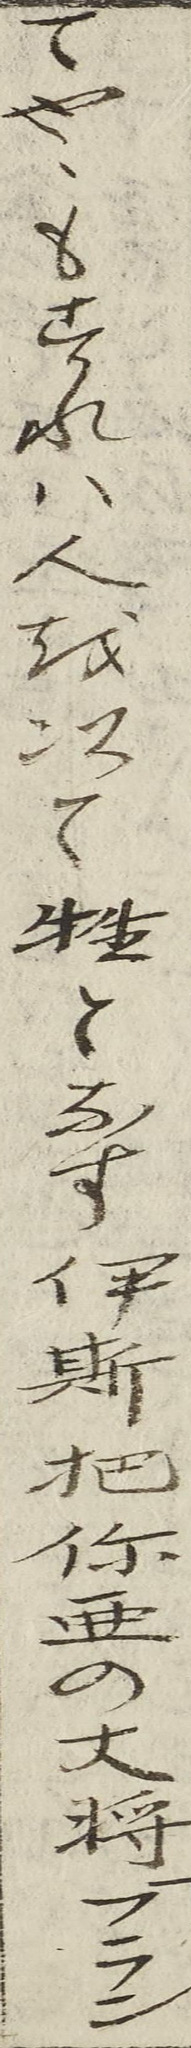てやゝもすれハ人を以て牲となす伊斯把你亜の大将「フラン
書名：西洋雜記　乾
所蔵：東京大学地震研究所図書室 Earthquake Research Institute Library, The University of Tokyo, JAPAN
